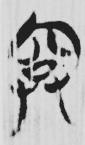弇
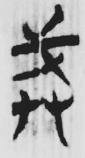戒
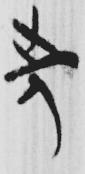先
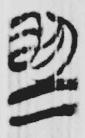則（則）
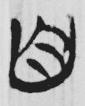自
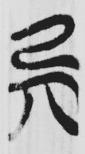○（欺）
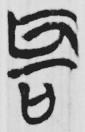○（始）
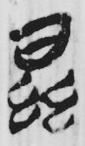○（顯）
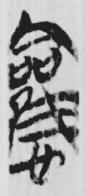懽（勸）
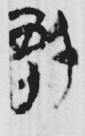○（信）
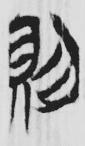則（則）
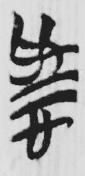○（偽）
